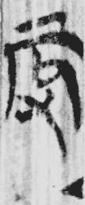辱
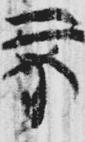不
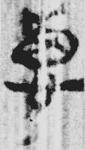惠
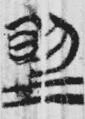則（則）
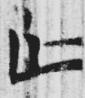亡（無）
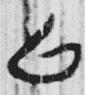㠯（以）
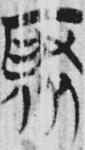聚
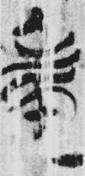民
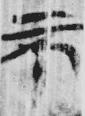不
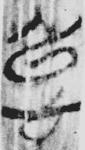○（仁）
